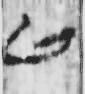㠯（以）
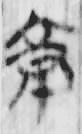○（就）
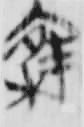○（集）
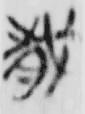歲（歲）
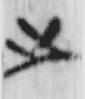之
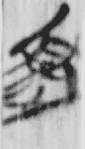○（夏）
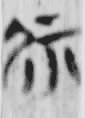𫵖
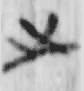之
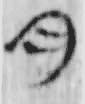月
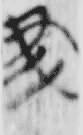○（盡）
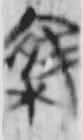○（集）
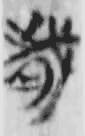歲（歲）
